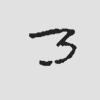乃
